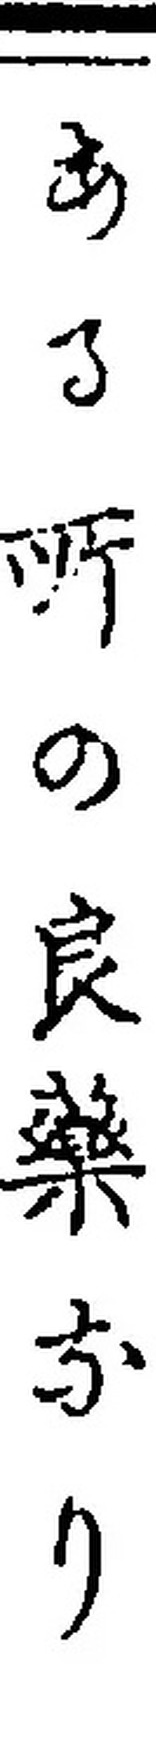ある所の良薬なり
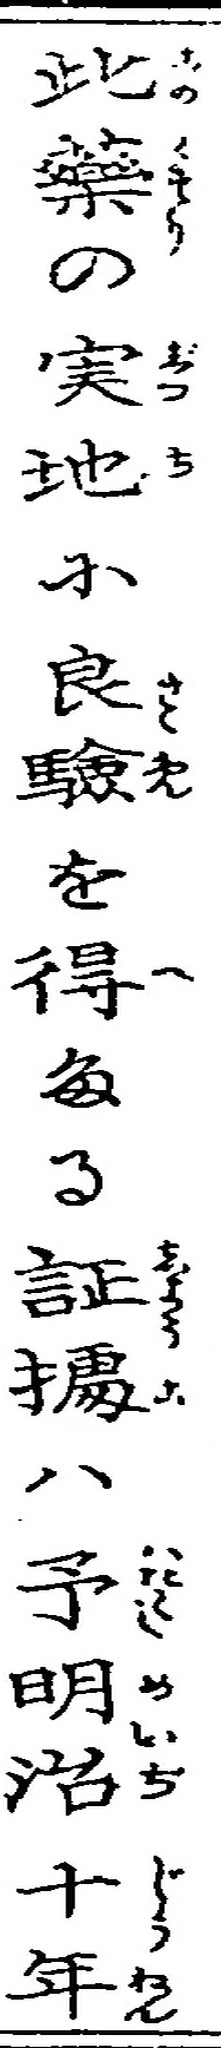此藥の実地に良験を得ふる証拠は予明治十年
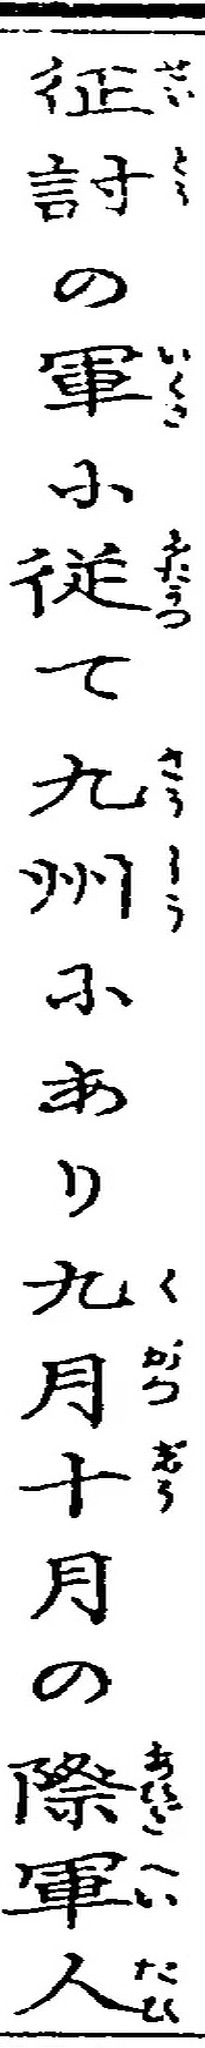征討の軍に従て九州にあり九月十月の際軍人
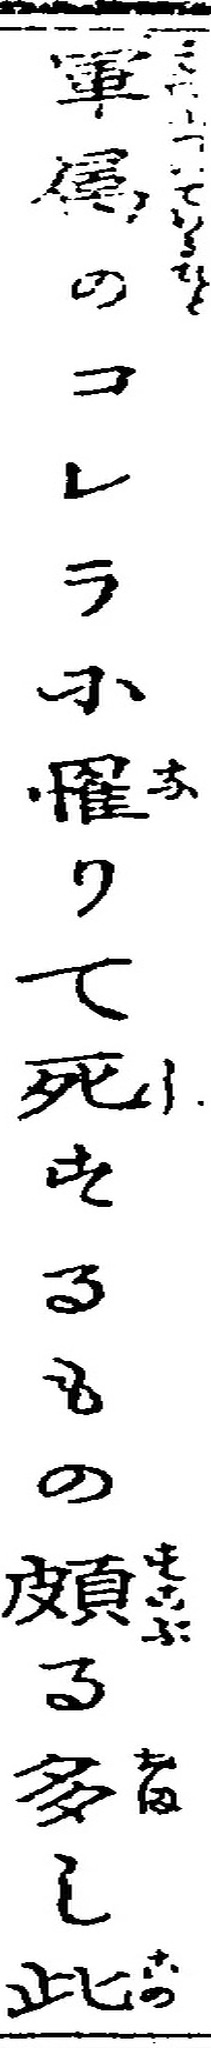軍属のコレラに罹りて死するもの頗る多し此
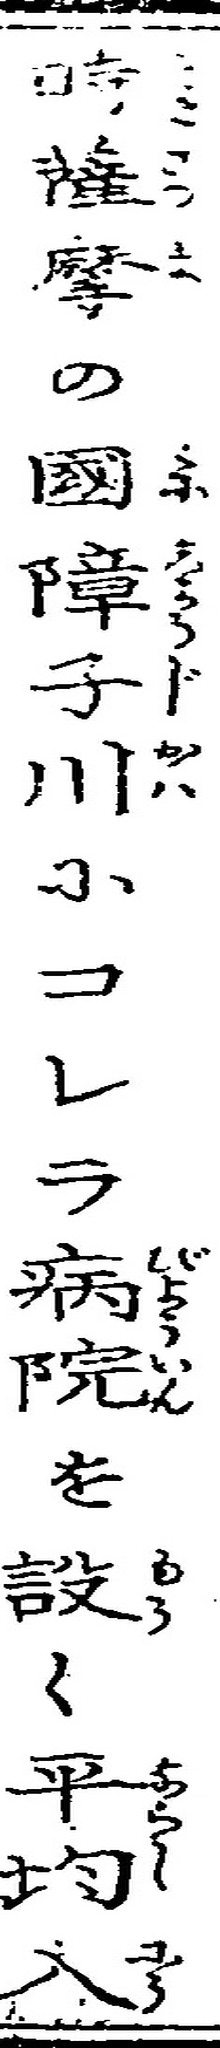時薩摩の國障子川にコレラ病院を設く平均入
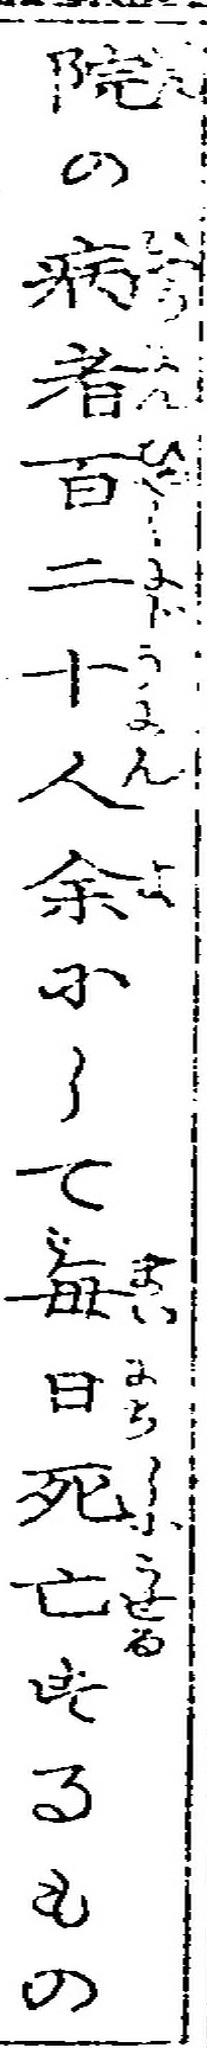院の病者百二十人余にして毎日死亡するもの
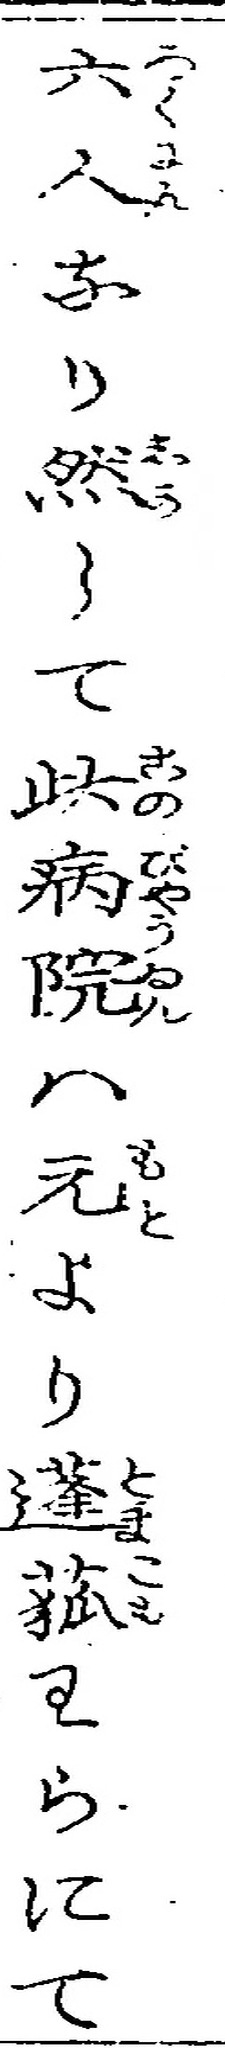六人なり然して此病院は元より蓬菰わらにて
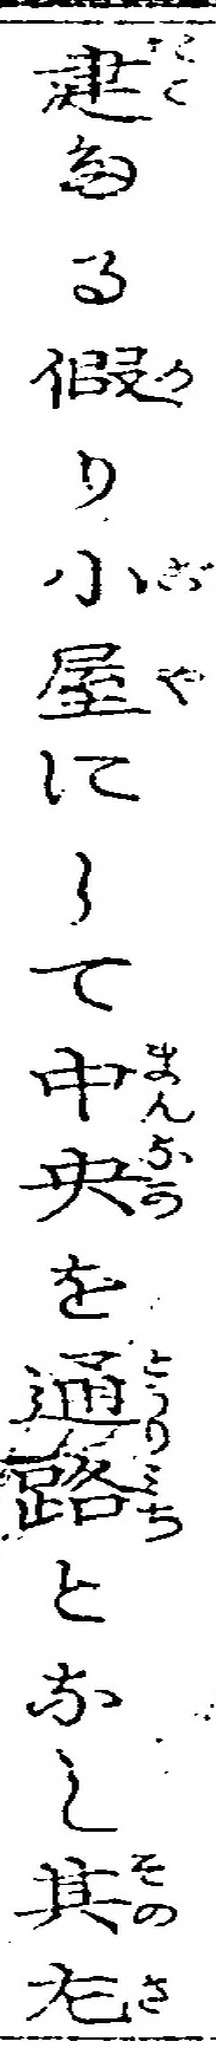建たる假り小屋にして中央を通路となし其左
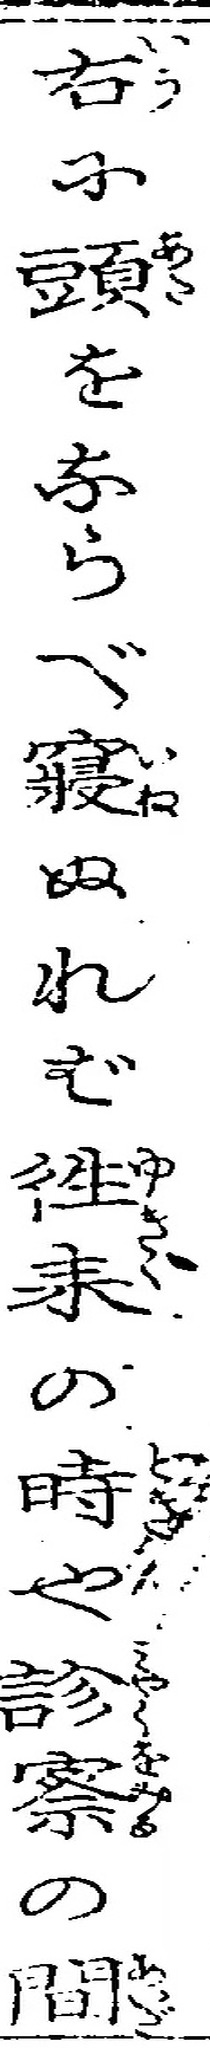右に頭をならべ寝ぬれば往来の時や診察の間
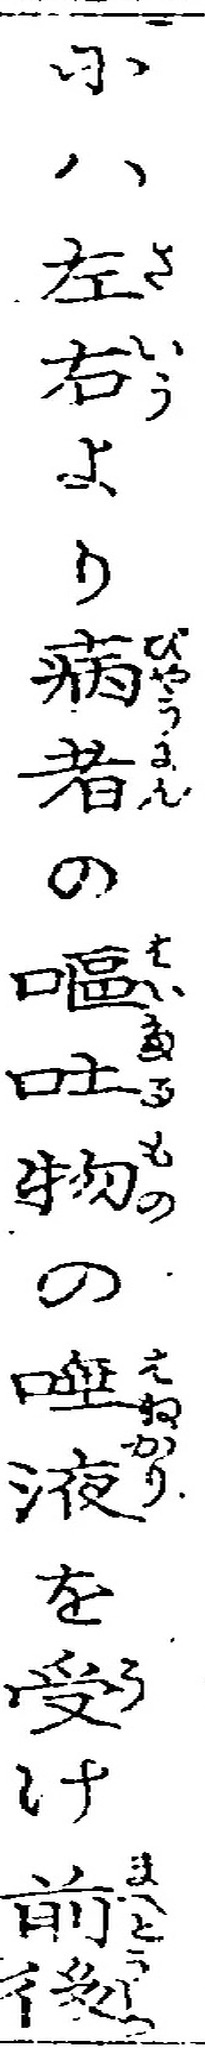には左右より病者の嘔吐物の唾液を受け前後
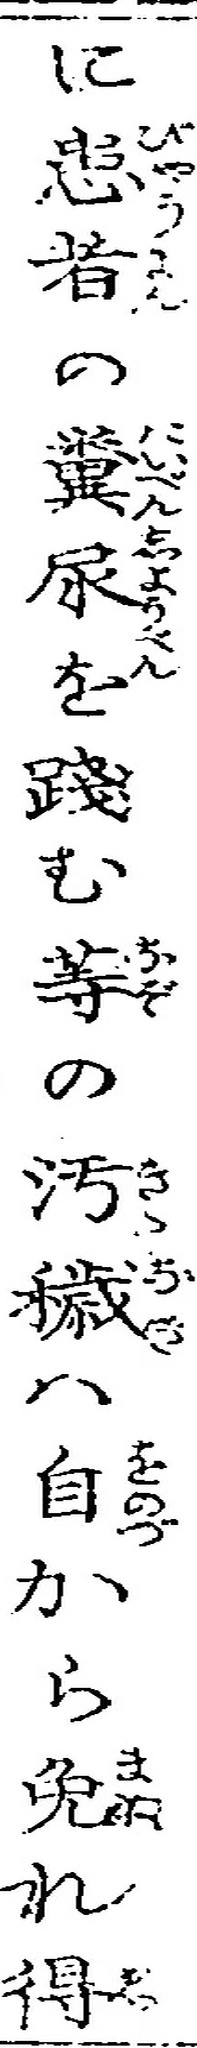に患者の糞尿を踐む等の汚穢は自から免れ得
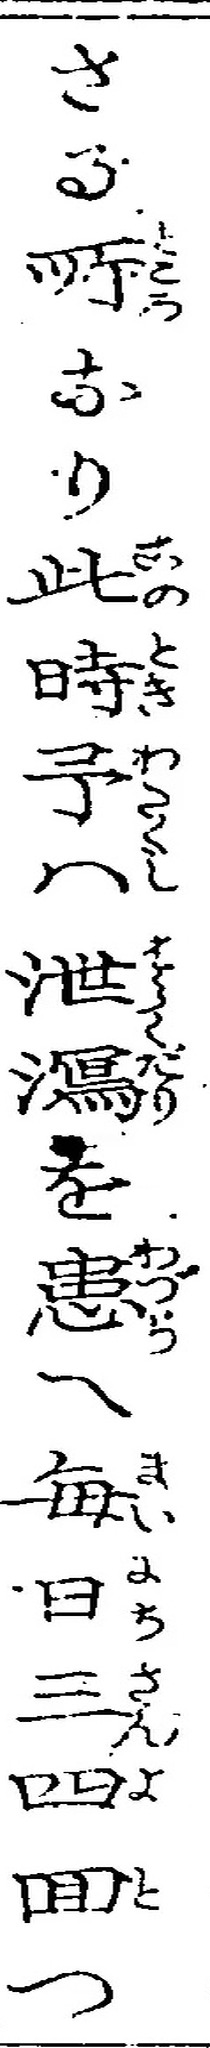さる所なり此時予は泄瀉患へ毎日三四回つ
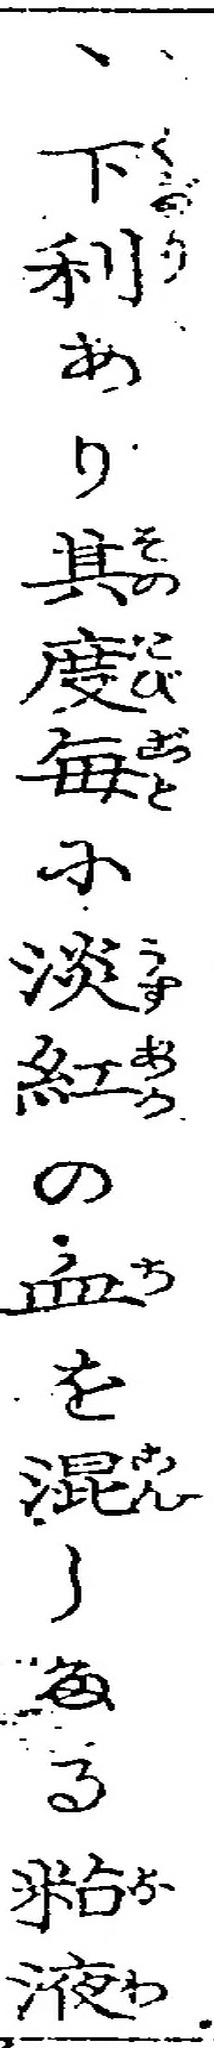ゝ下利あり其度毎に淡紅の血を混したる粘液
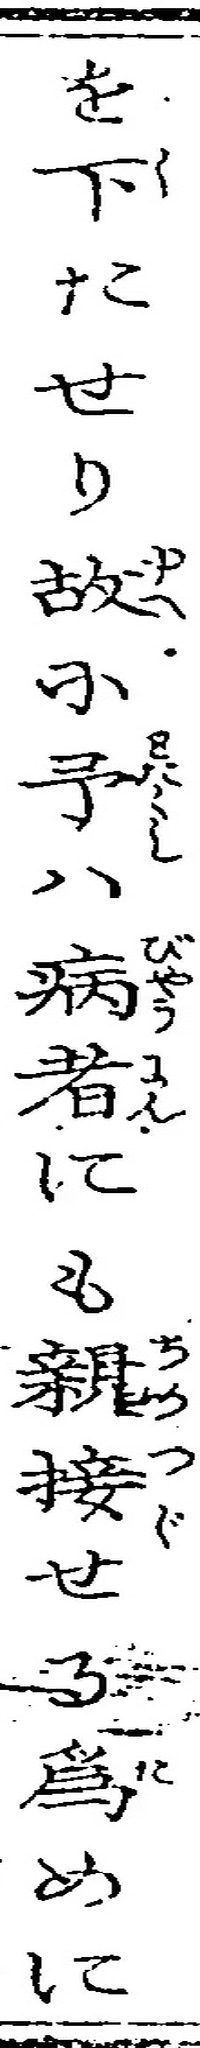を下たせり故に予は病者にも親接せる為めに
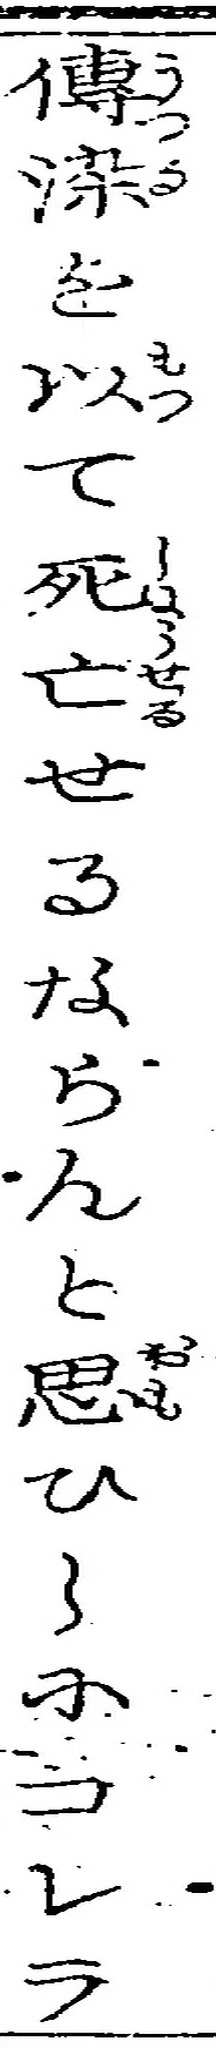傳染を以て死亡せるならんと思ひしにコレラ

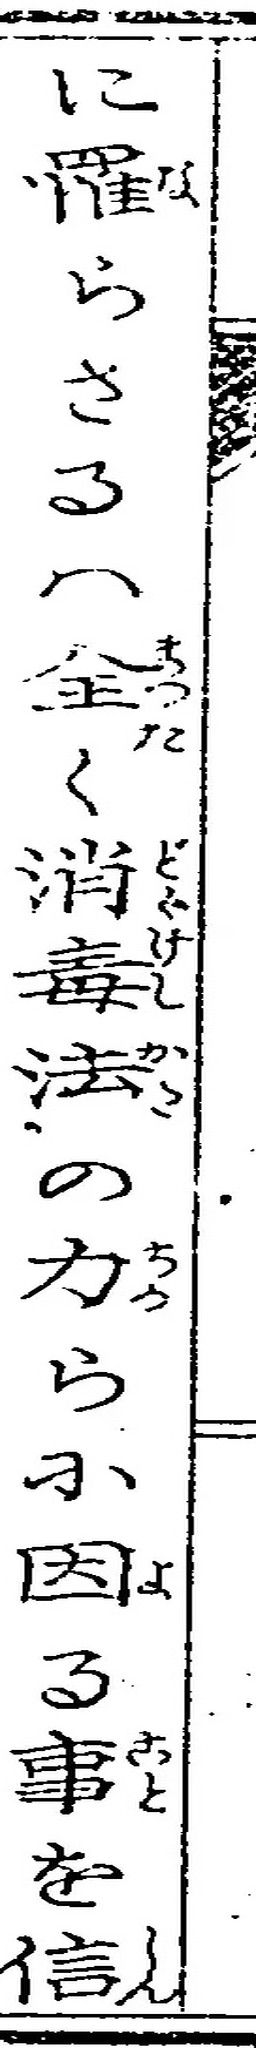に罹らさるは全く消毒法の力らに因る事を信
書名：虎列剌予防民間の心得
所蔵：国立国会図書館 National Diet Library, JAPAN
